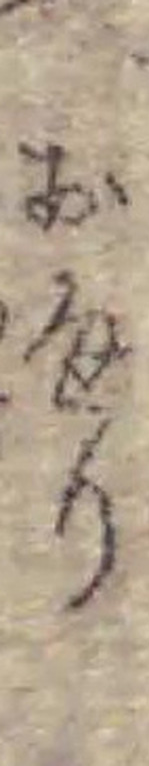お通り
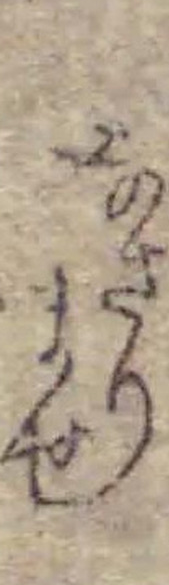なさり
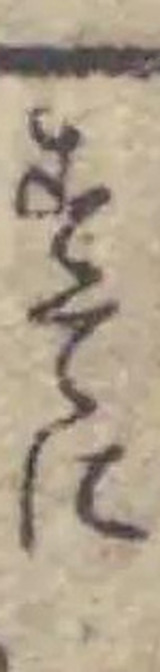すてに
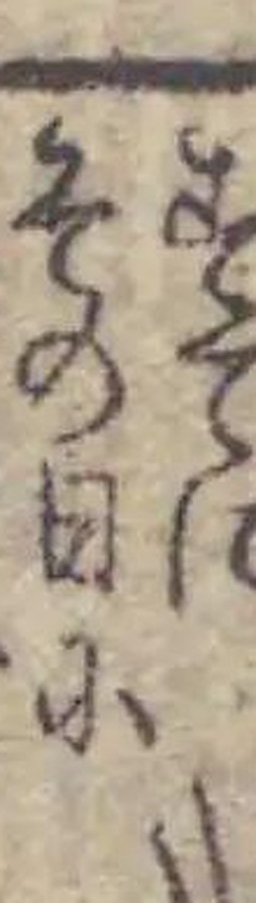その日に
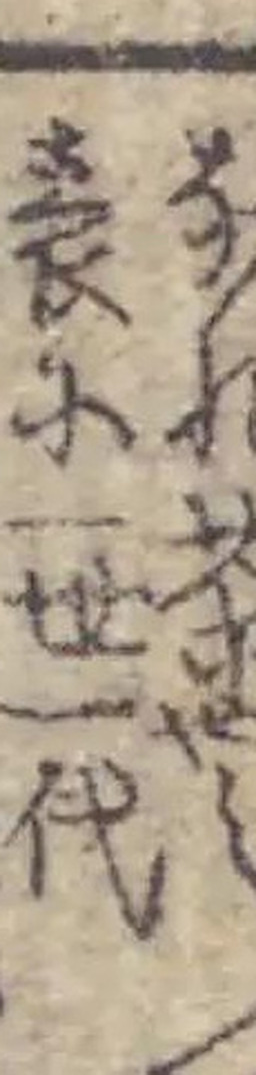表に一世一代
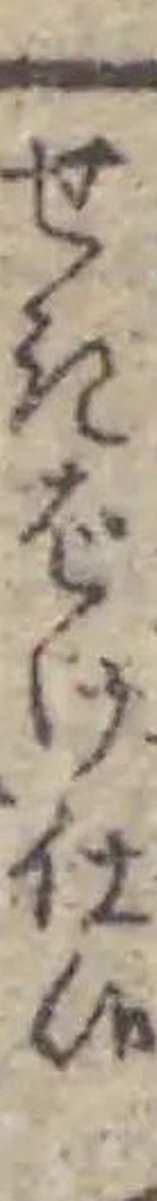せきばけ仕候
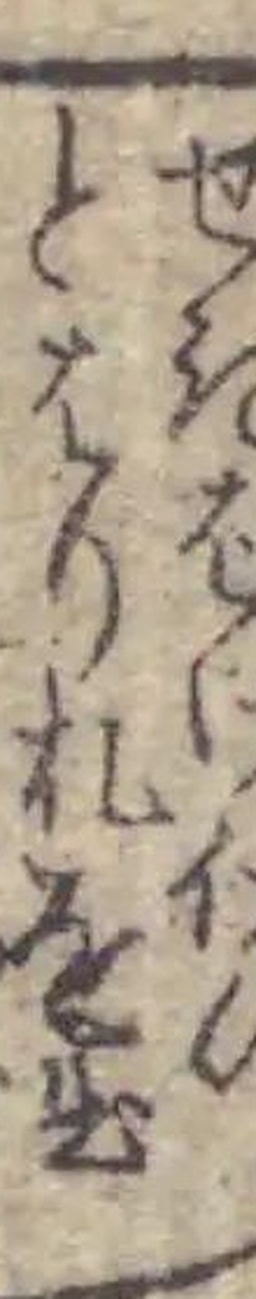とはり札を出
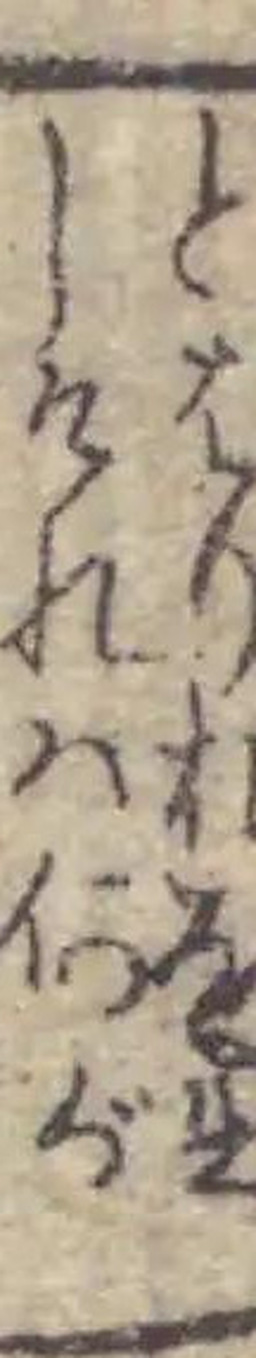しけれは何が
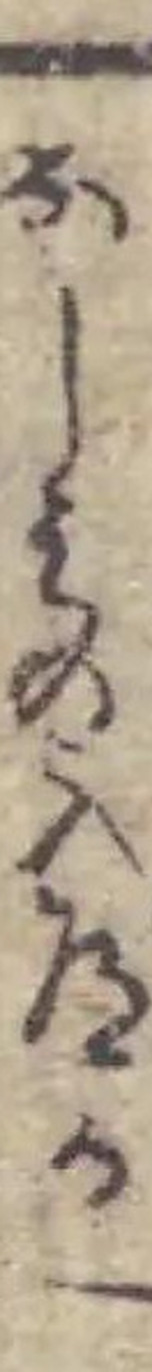おしみの入道か
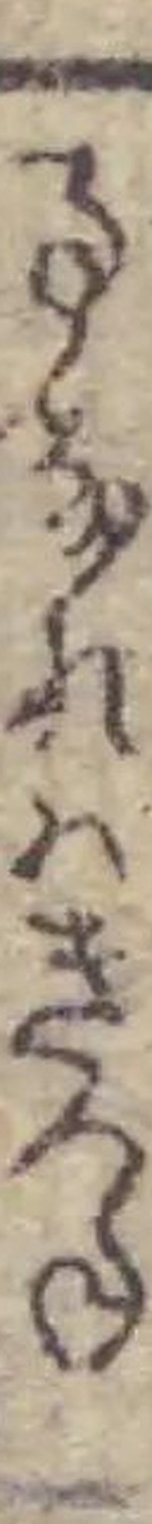事なれはきつね
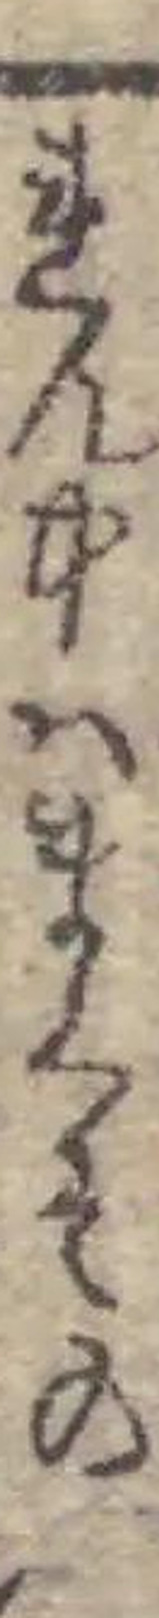れん中はまくその
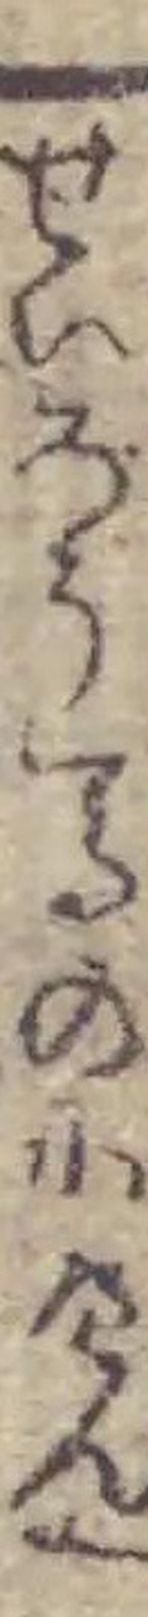せいろう馬の小へん
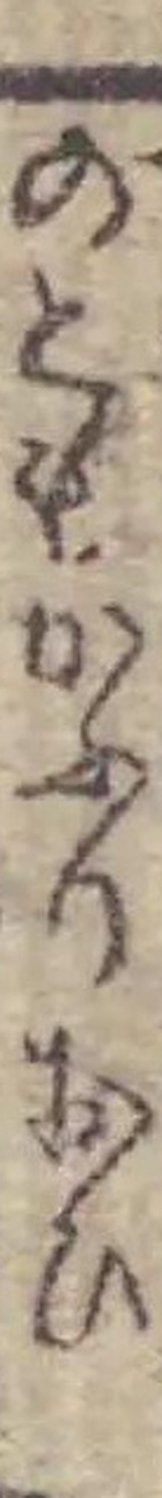のこもかふりおひ
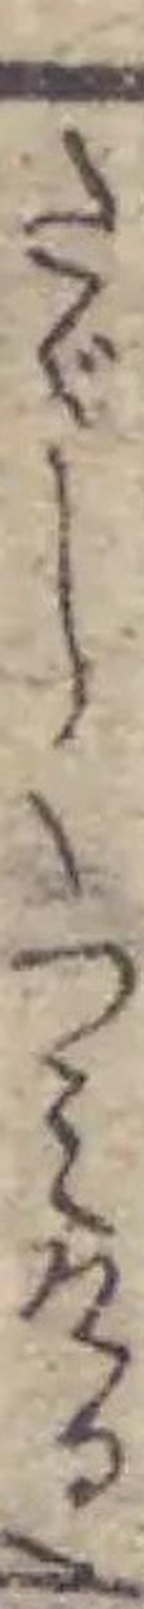たゞしくつみける
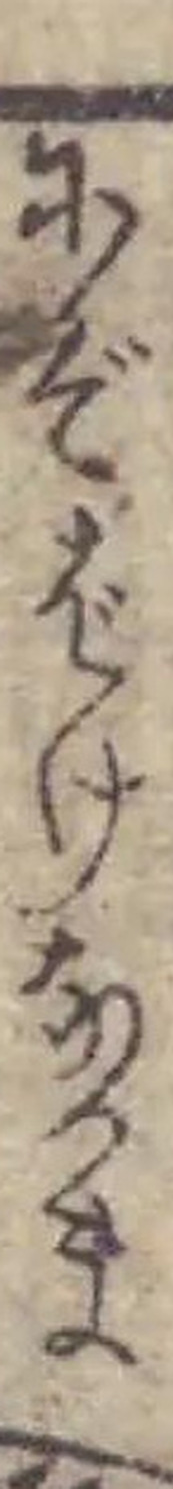にぞばけなかま
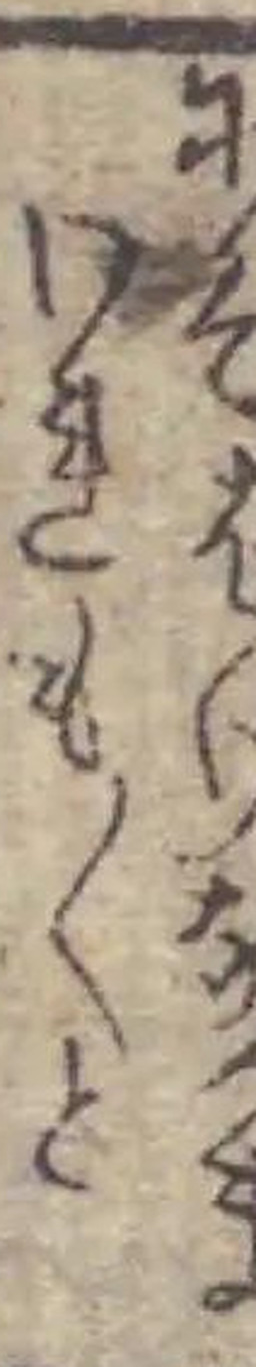われも〳〵と
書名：作意妖恐懼感心 2巻
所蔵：国立国会図書館 National Diet Library, JAPAN
